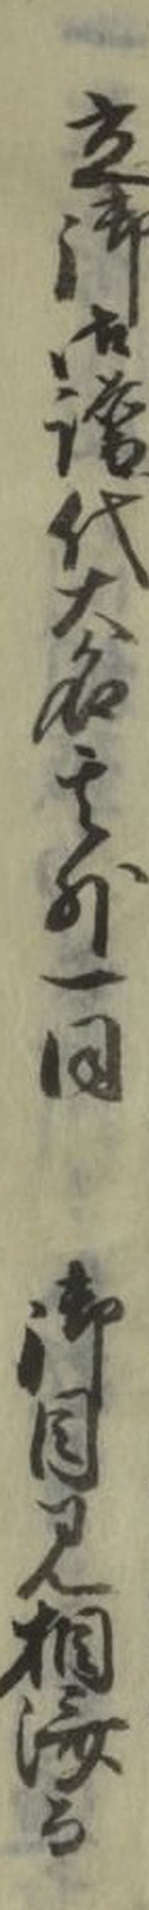立御御譜代大名其外一同御目見相済而入御

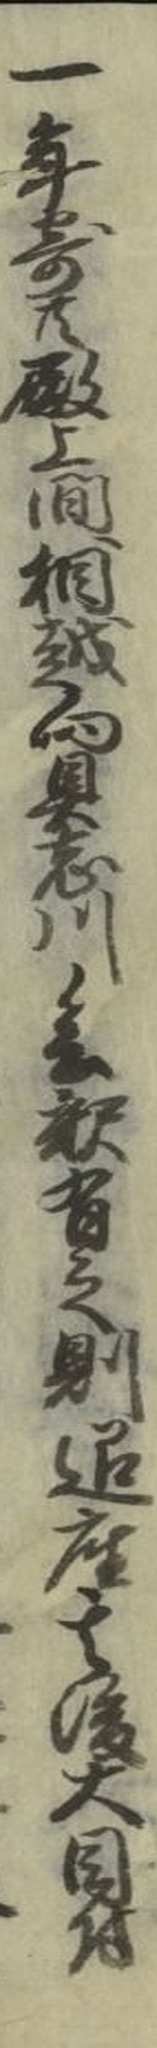一年寄共殿上間へ相越而具志川会釈有之則退座其後大目付
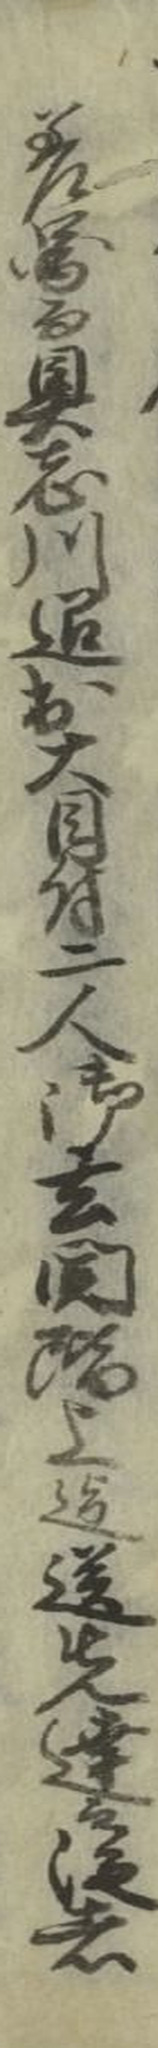差図而具志川退出大目付二人御玄関階上迠送先達而従者
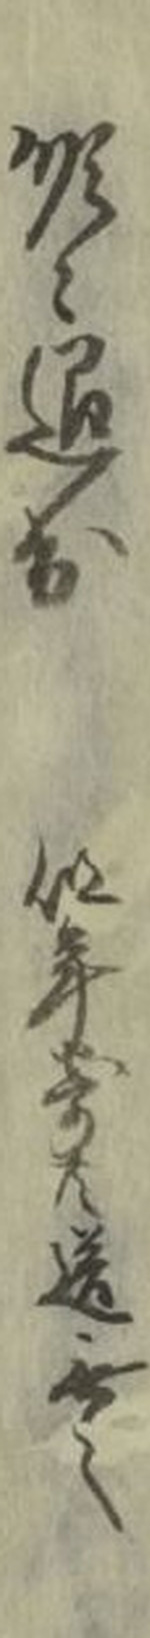順々退出但年寄共送無之
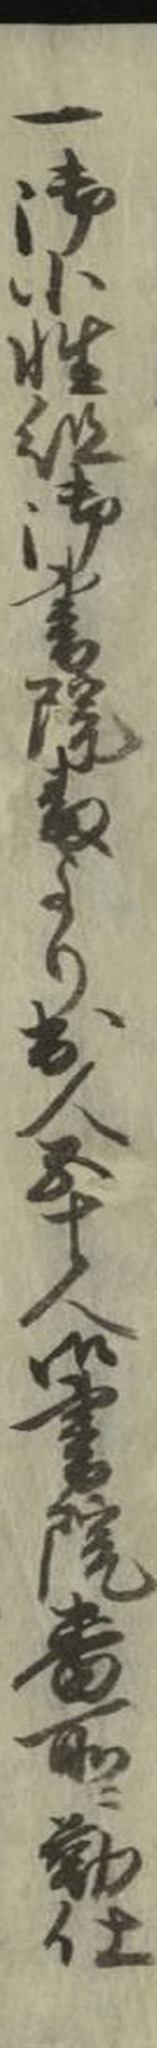一御小姓組御書院番より出人五十人御書院番所に勤仕
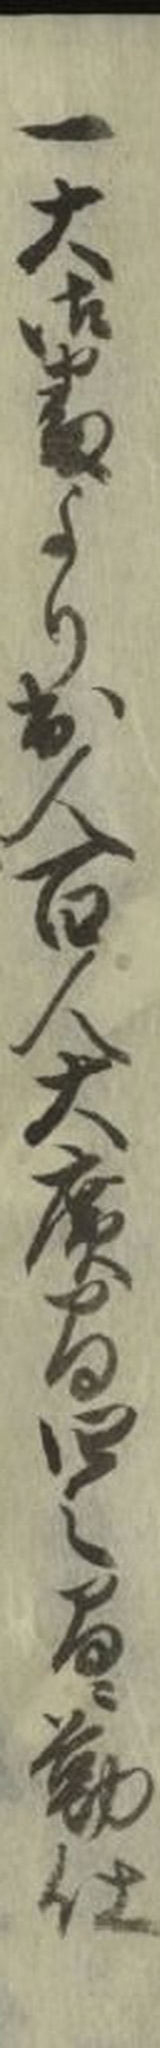一大御番より出人百人大広間四之間に勤仕
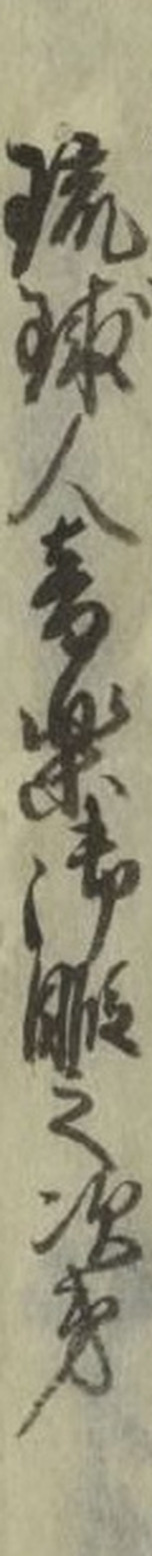琉球人音楽御暇之次第
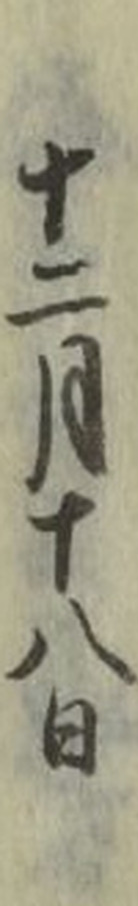十二月十八日
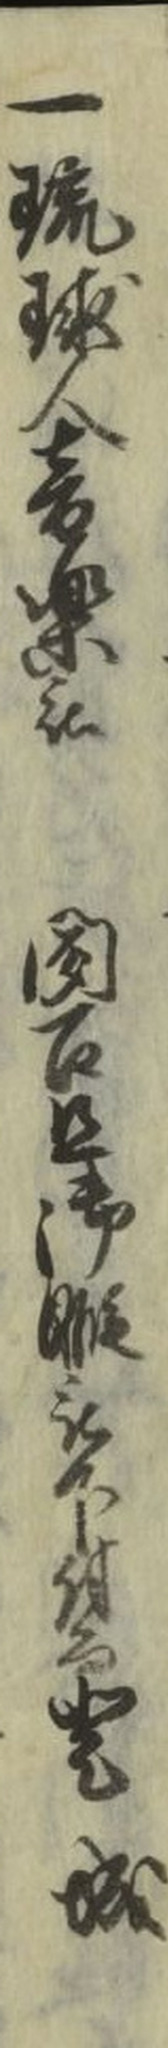一琉球人音楽被聞召且御暇被下付而登城
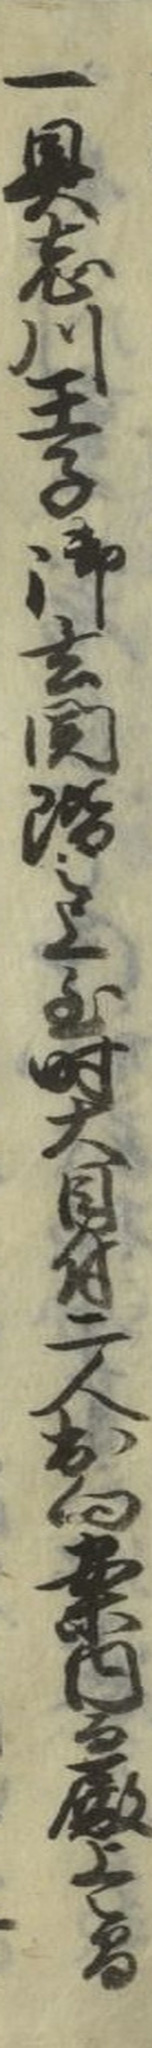一具志川王子御玄関階之上至時大目付二人出向案内而殿上之間
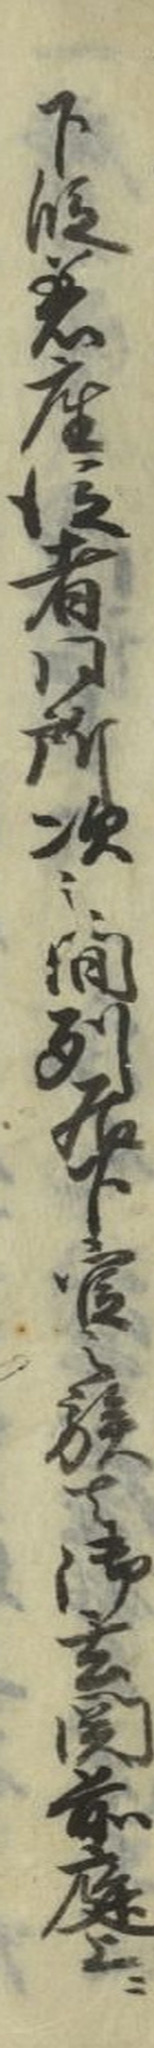下段着座従者同所次之間列居下官之族は御玄関前庭上に
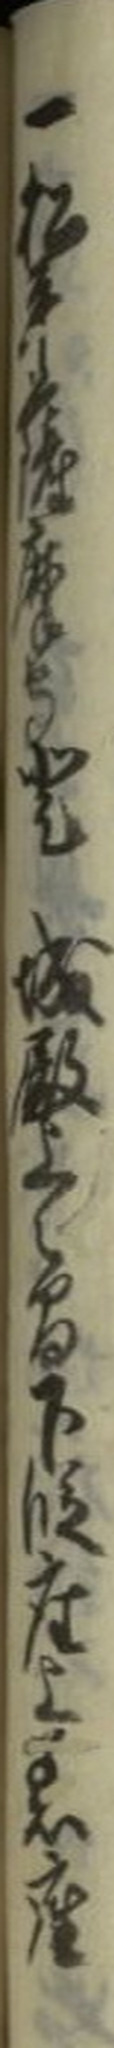一松平薩摩守登城殿上之間下段座上着座
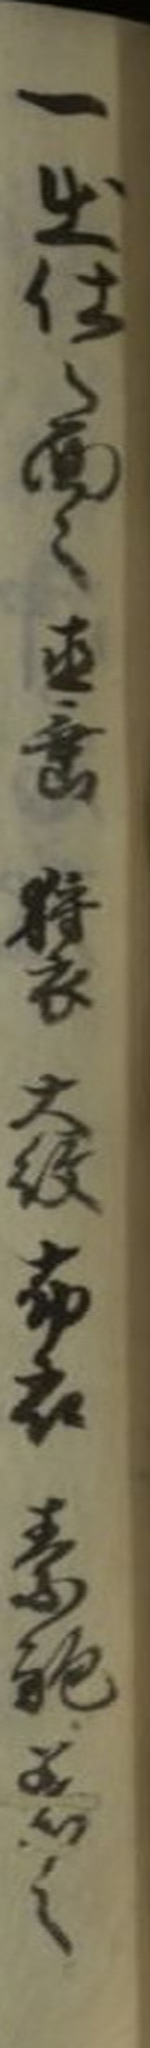一出仕之面々直垂狩衣大紋布衣素袍着之
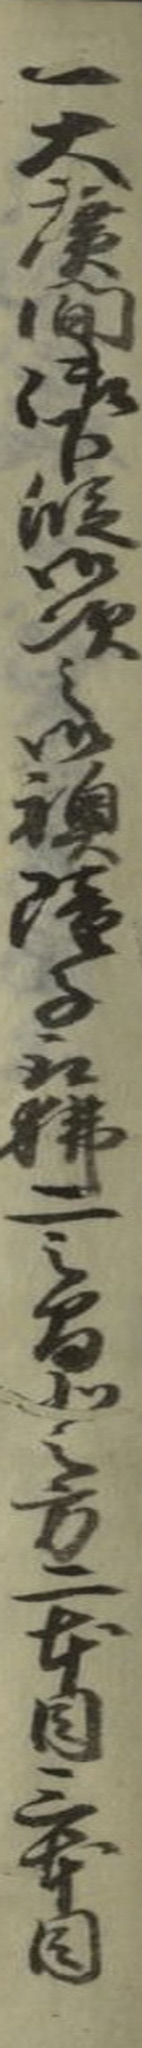一大広間御下段御次之御襖障子取払二之間北之方二本目三本目
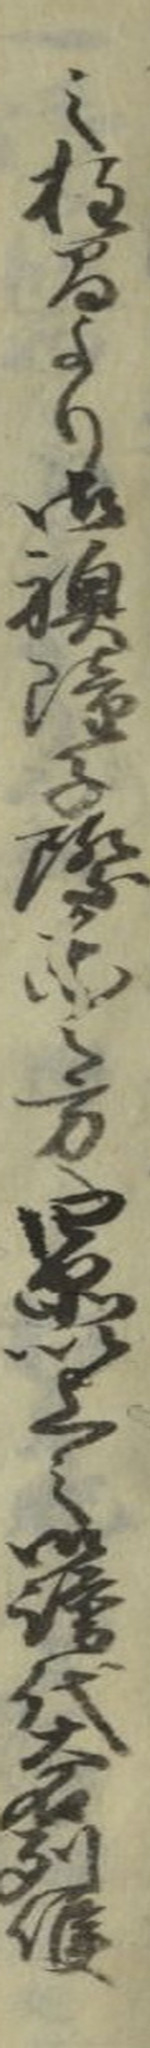之板間より御襖障子際東之方へ四品以上之御譜代大名列候
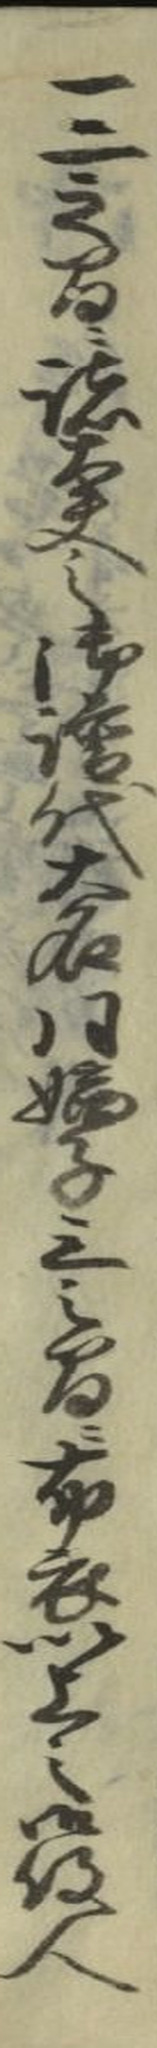一二之間に諸大夫之御譜代大名同嫡子三之間に布衣以上之御役人
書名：琉球人来朝之記
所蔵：University of the Ryukyus Library
